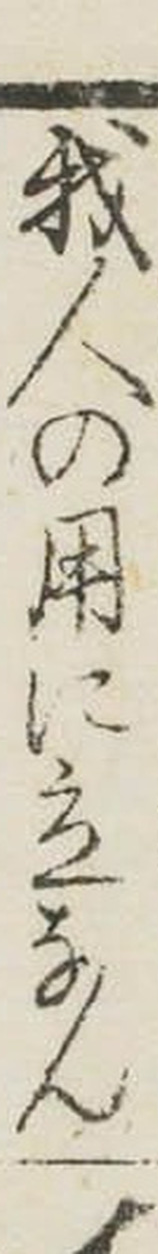我人の用に立なん
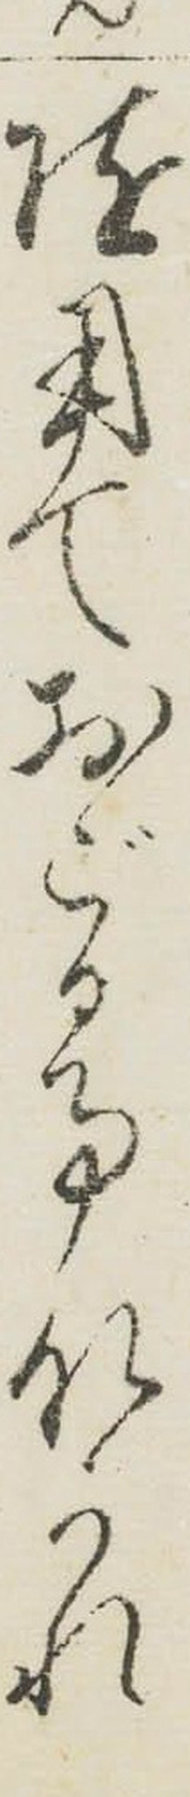随用ておごる事なかれ
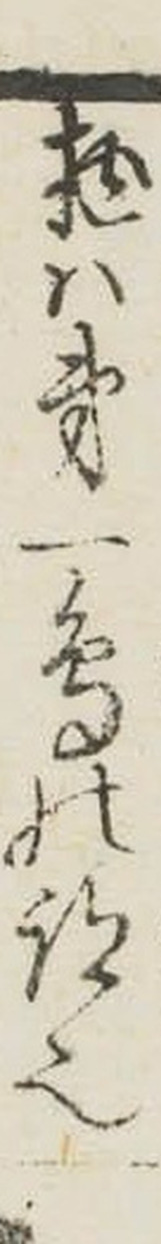物は第一鳥の跡也
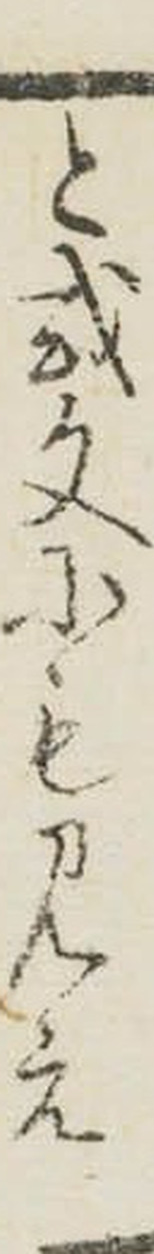と或文にも見え
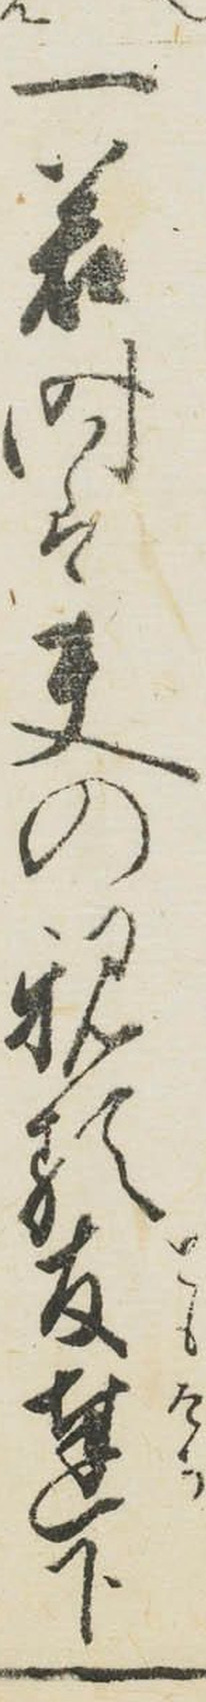一若時は夫の親類友達下
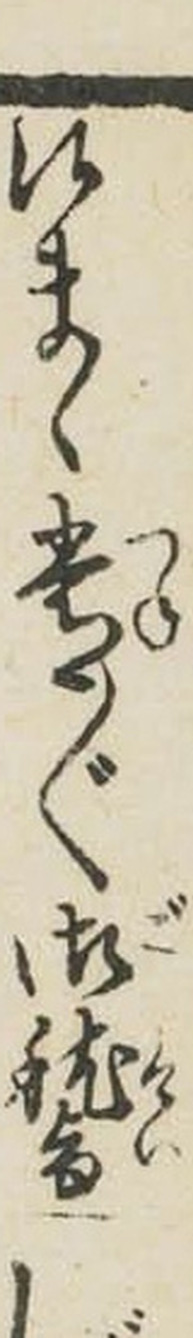候まゝ常〴〵御稽
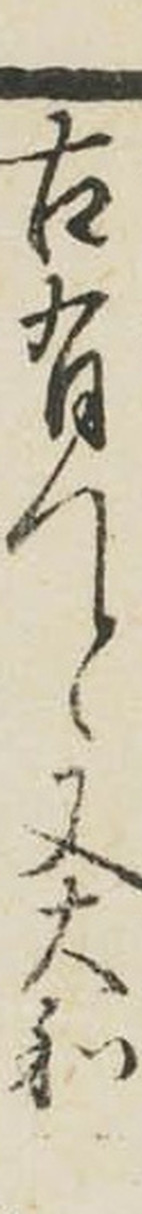古有こと又大和
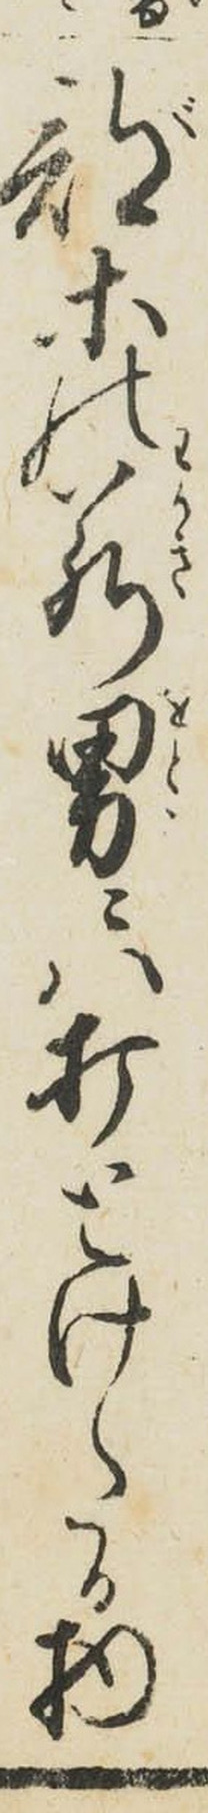部等の若男打とけたる物
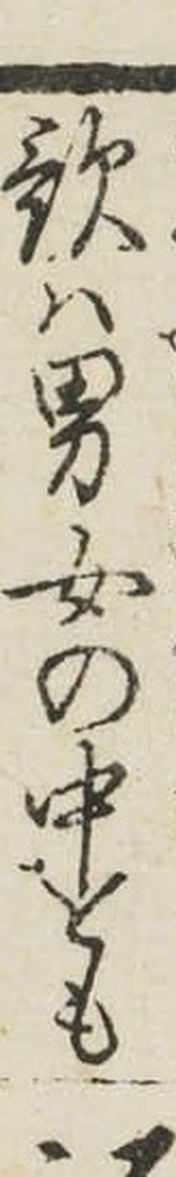歌は男女の中をも
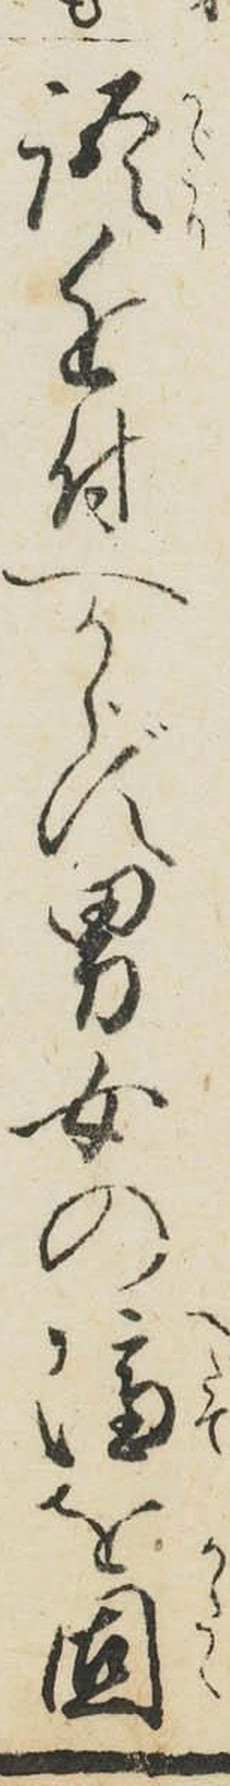語を付へからず男女の隔を固
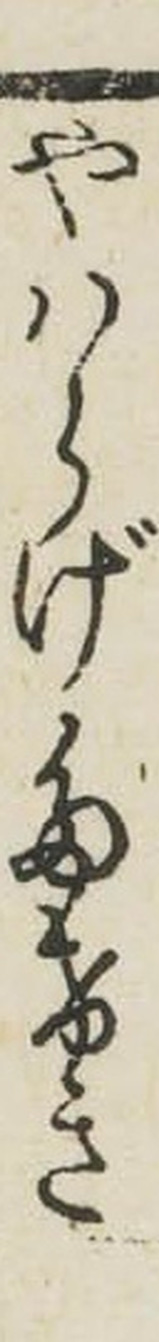やはらげたけき
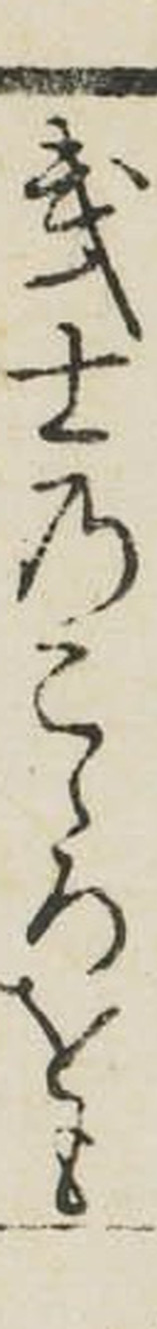武士のこゝろをも
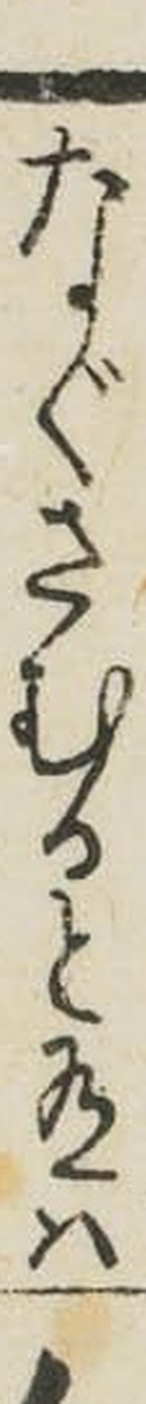なぐさむると有は
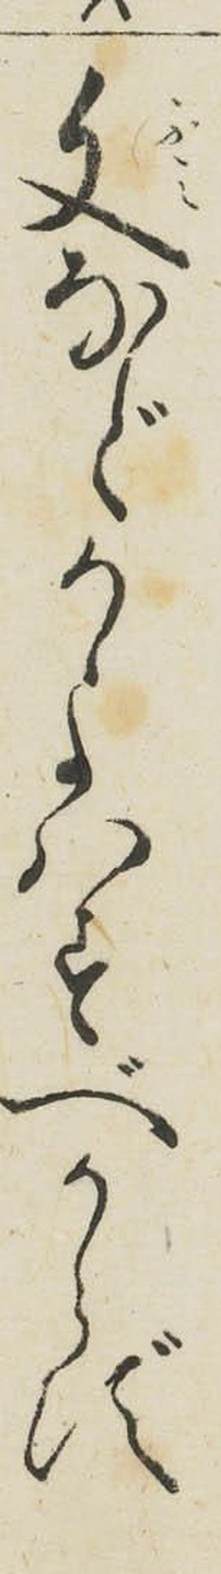文などかよはすべからず
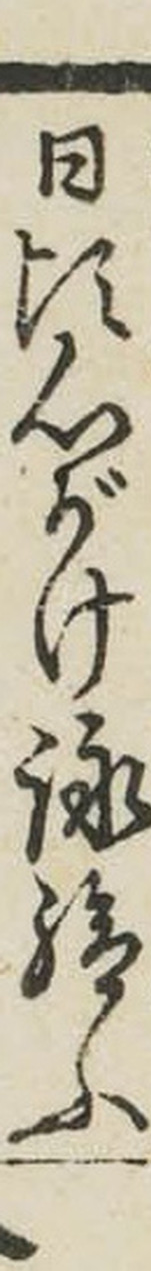日頃心がけ詠給ふ
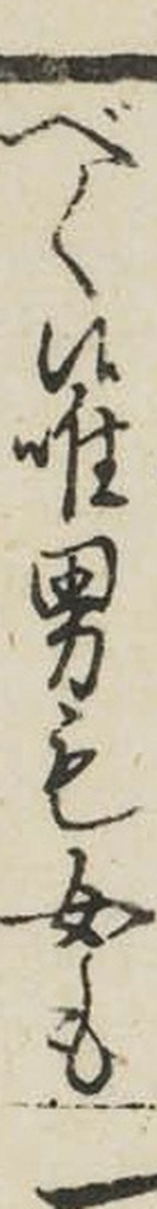べく候唯男も女も
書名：女大学
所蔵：東京学芸大学教育コンテンツアーカイブ
